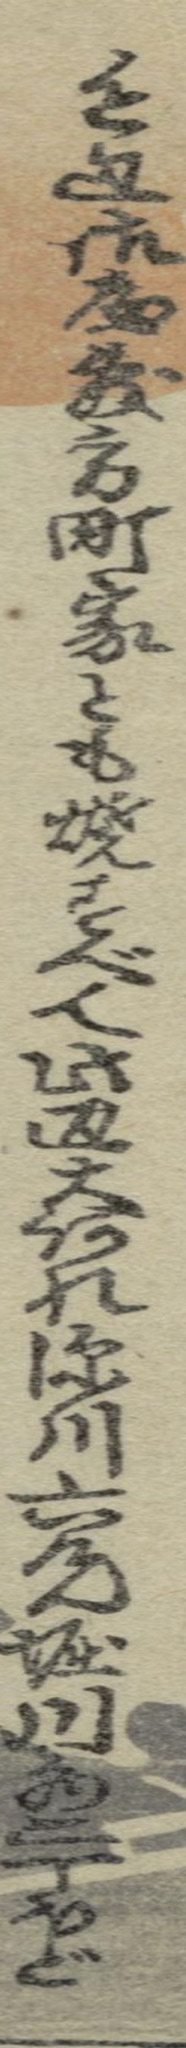近辺御屋敷方町家とも焼すべて此辺大あれ深川六けん堀川西ニ丁ほど
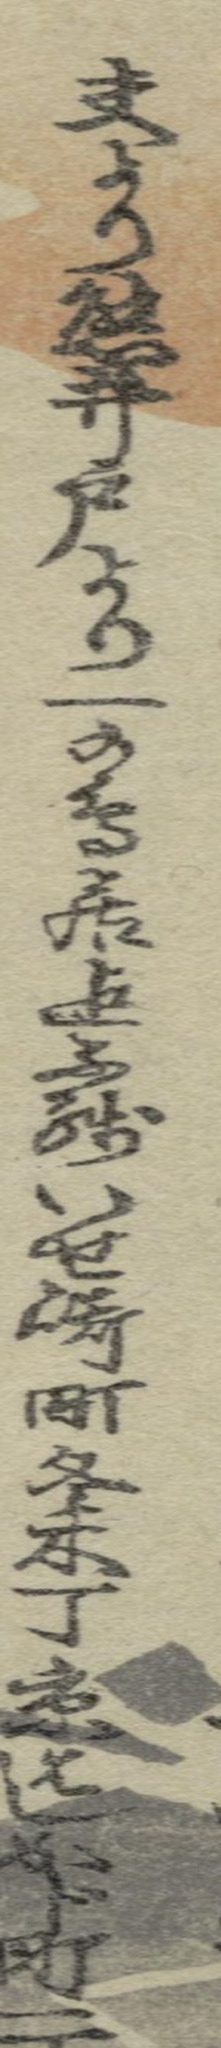夫より熊井戸より一の鳥居迄不残いせ崎町冬木丁京はしかじ町一丁
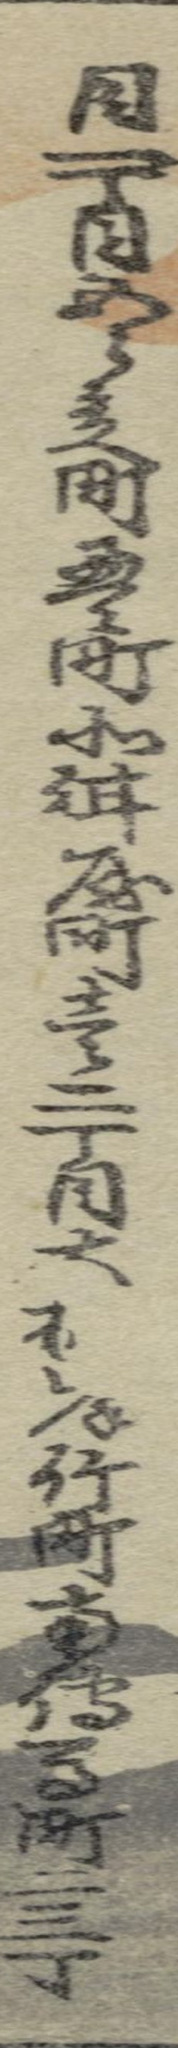目一丁目五郎兵衛町畳町北紺屋町壱ニ丁目大伝馬竹町南伝馬町二三丁
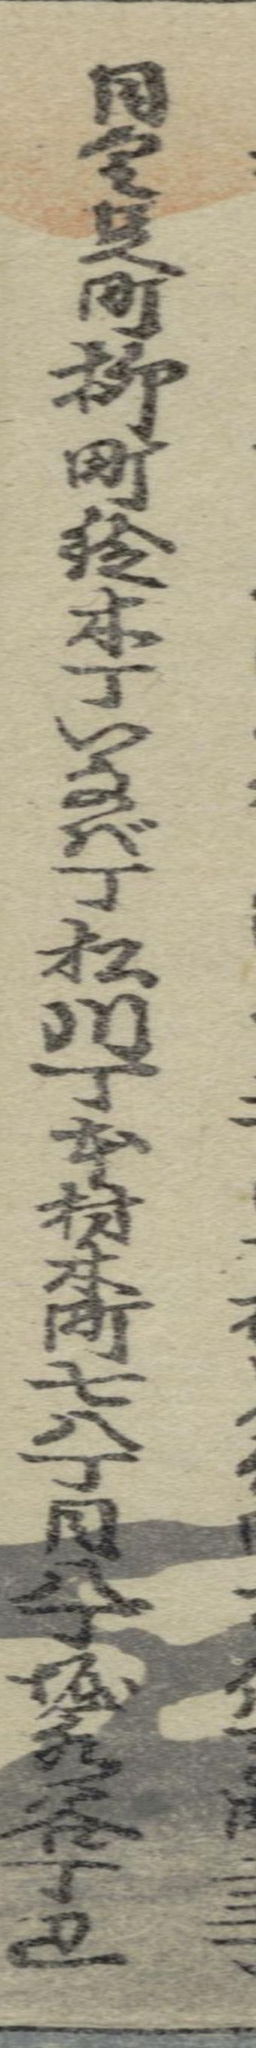目具足町柳町鈴木丁いなば丁松川丁本材木町七八丁目八丁堀水谷丁辺
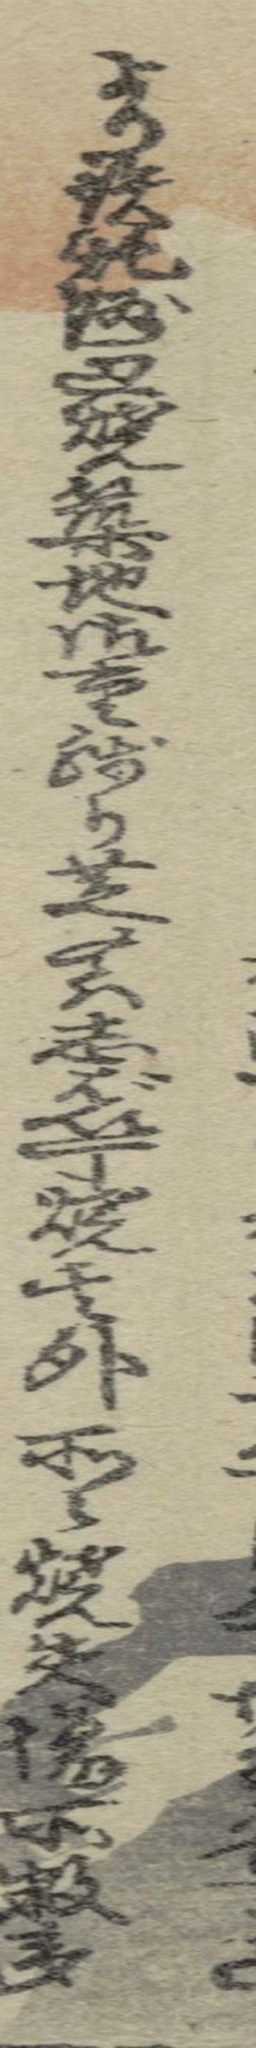より鉄砲洲辺焼ル築地御堂残り芝にてはしばい丁焼其外所々焼失場所数多
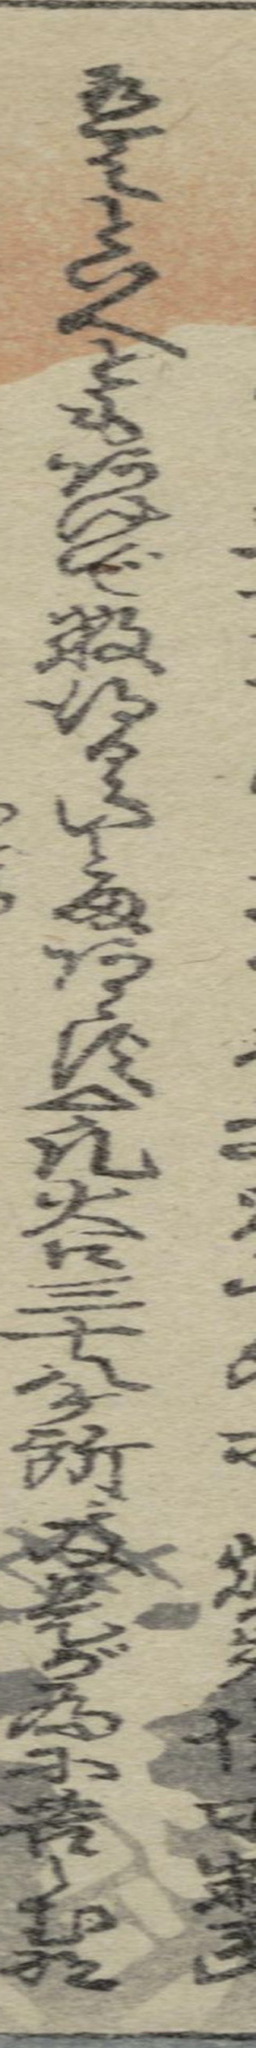有之といへともあけて数得るゝいとまあらす△凡火口三十八ケ所に及是が為に苦しむ様
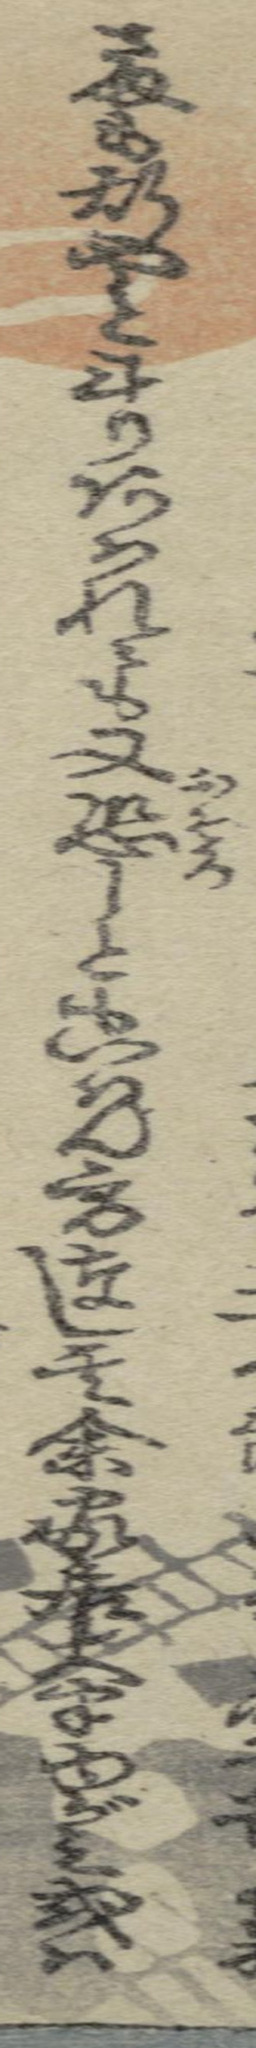さたも斯やと斗りあられにも又恐しともいはん方なし其余家居大半ゆがみ或は
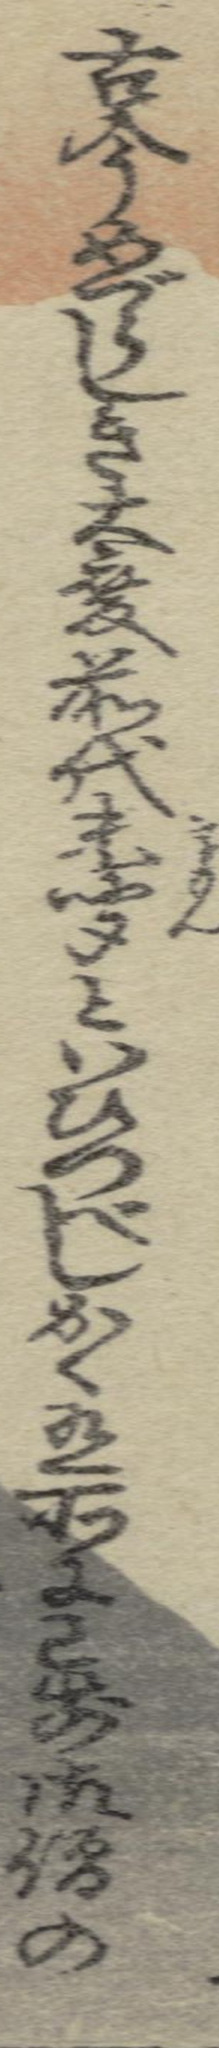古今めづらしき大変前代未聞といひつべしかく有所に已前御僧の
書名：江戸大地震大火方角附　世直り細見
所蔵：東京大学地震研究所図書室 Earthquake Research Institute Library, The University of Tokyo, JAPAN
